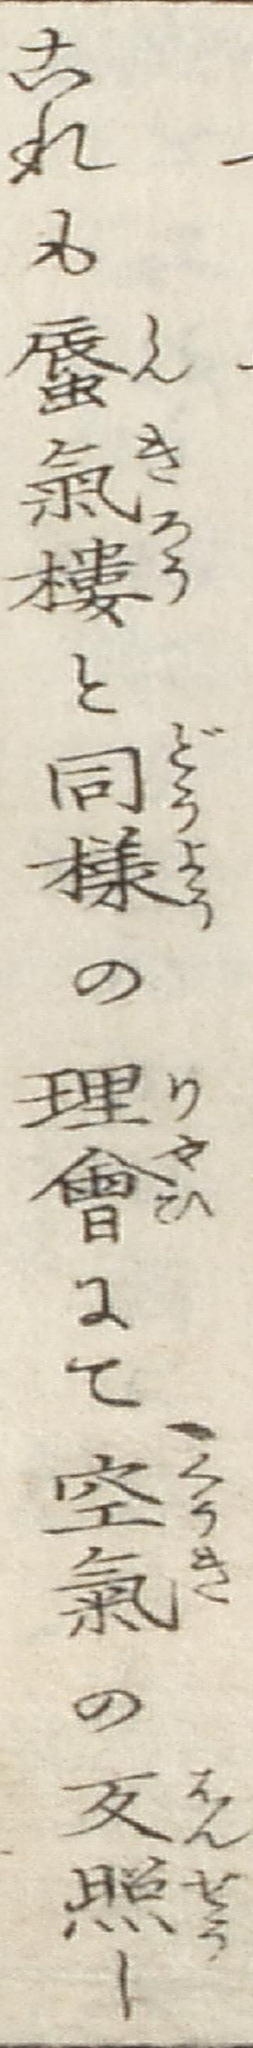これも蜃気楼と同様の理会にて、空気の反照し
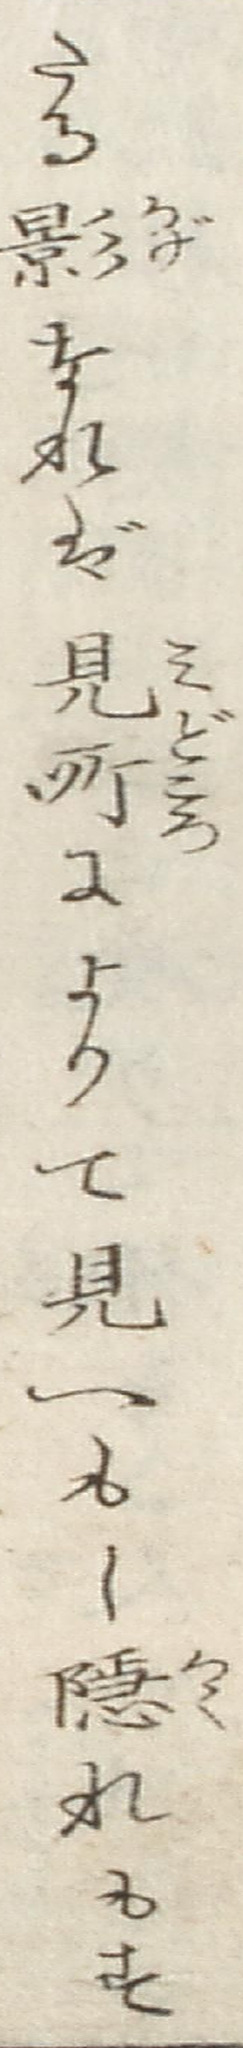たる影なれば見所によりて見へもし隠れもす
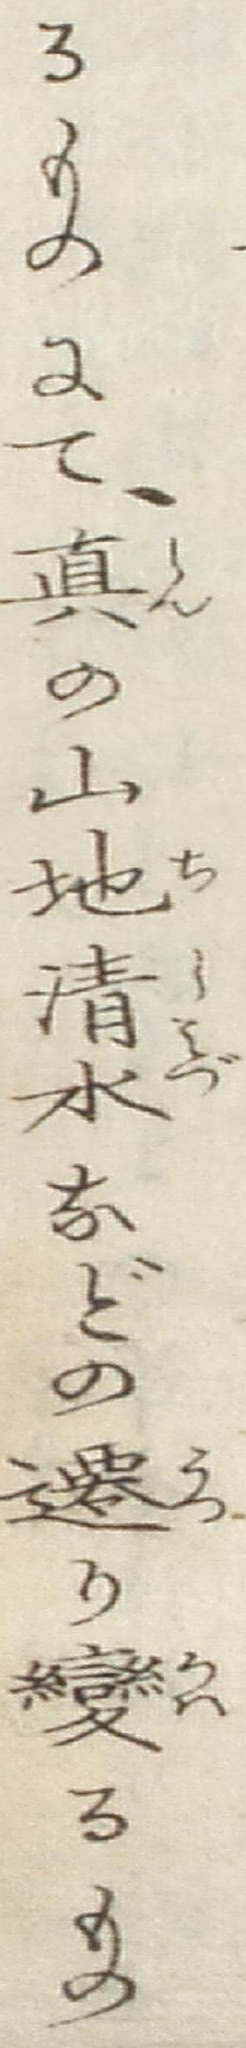るものにて、真の山地清水などの遷り変るもの
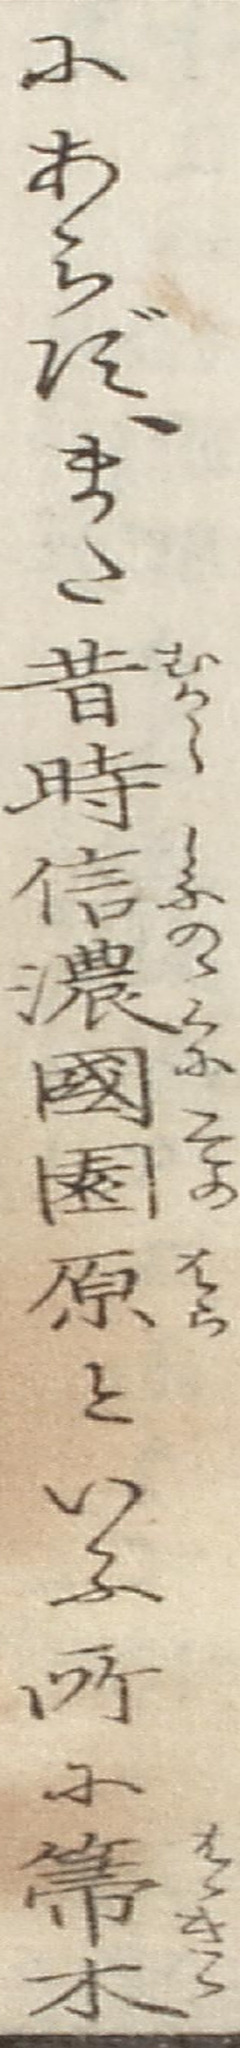にあらず、また昔時信濃国園原といふ所に箒木
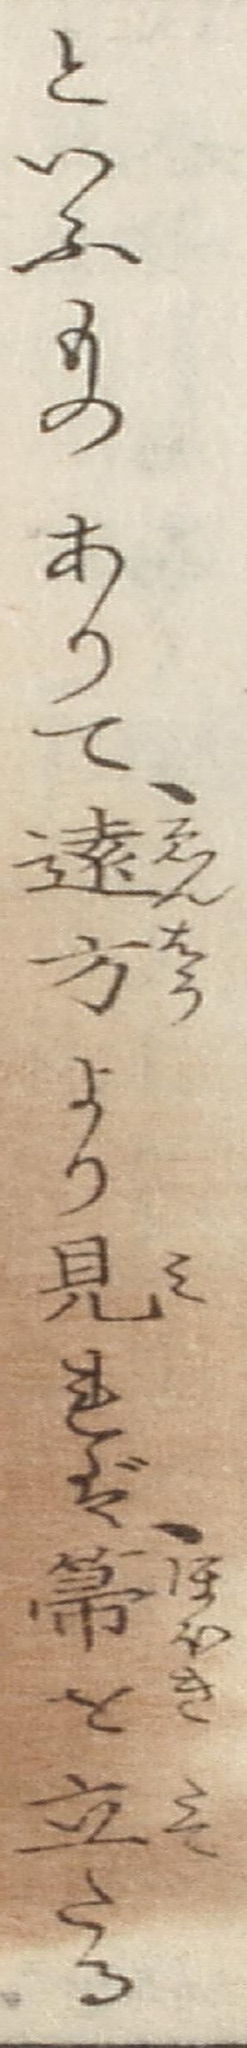といふものありて、遠方より見れば、箒を立たる
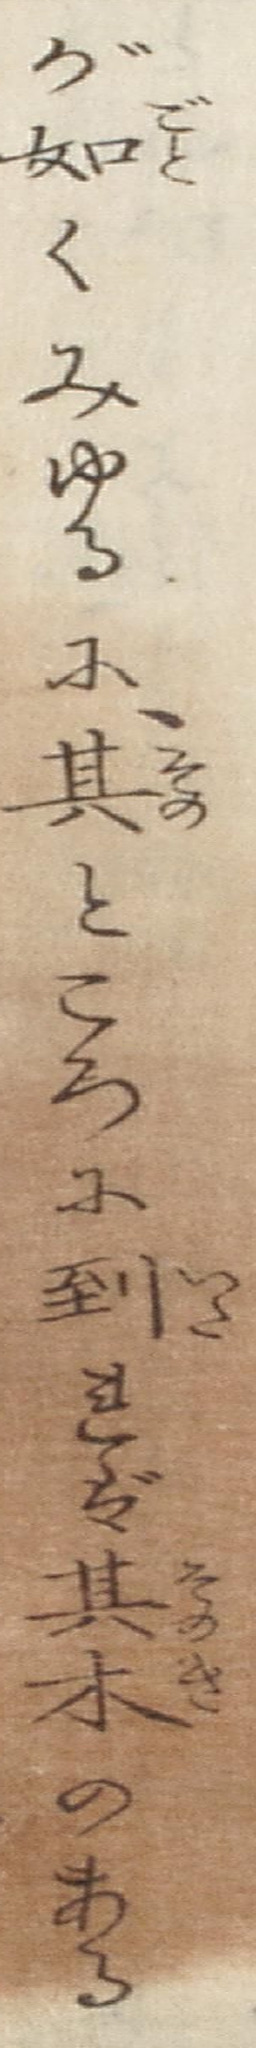が如くみゆるに、其ところに到れば其木のある
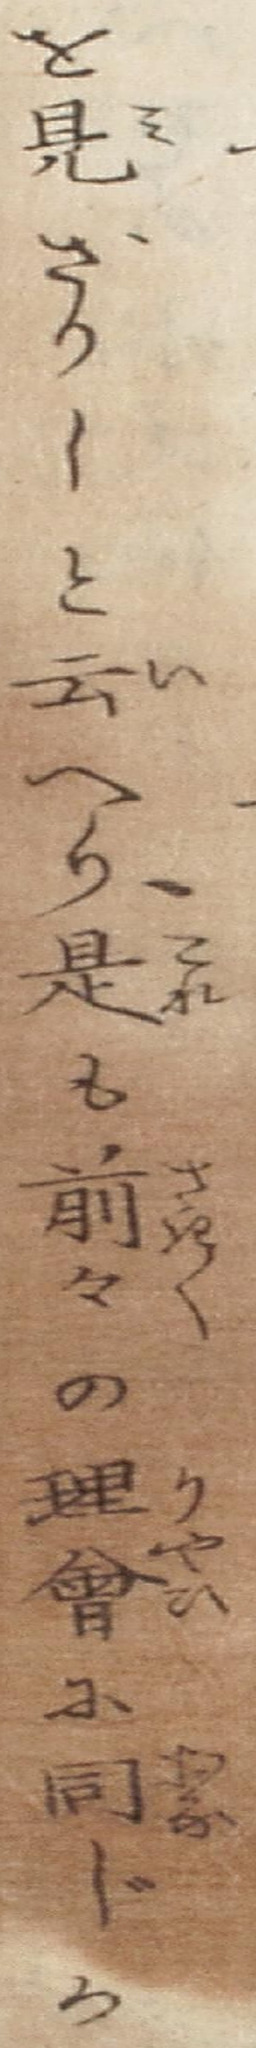を見ざりしと云へり、是も前々の理会に同じか
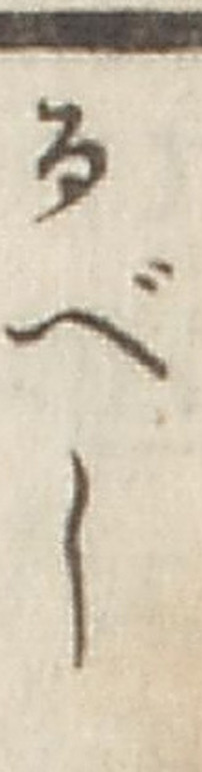るべし
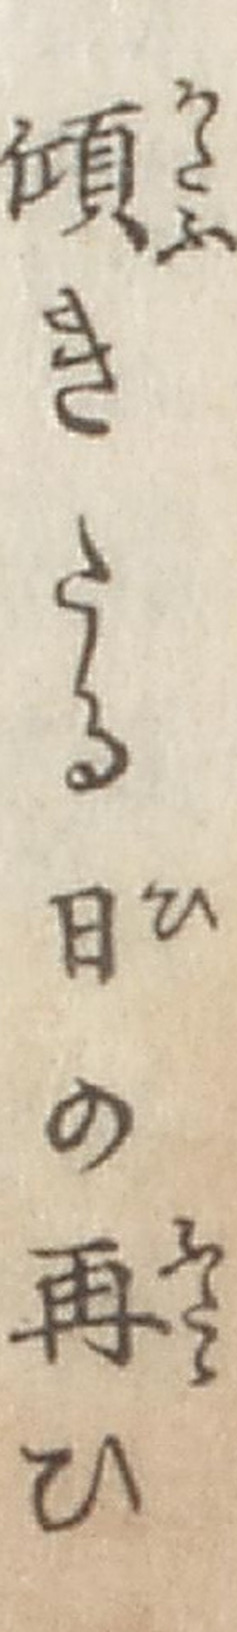傾きたる日の再ひ
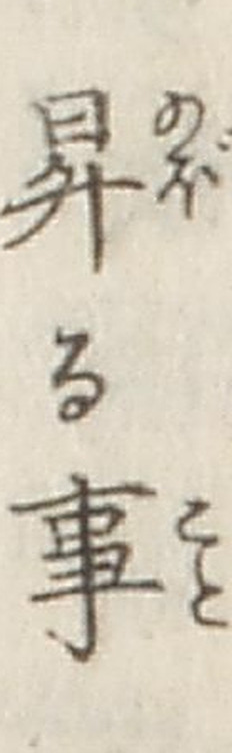昇る事
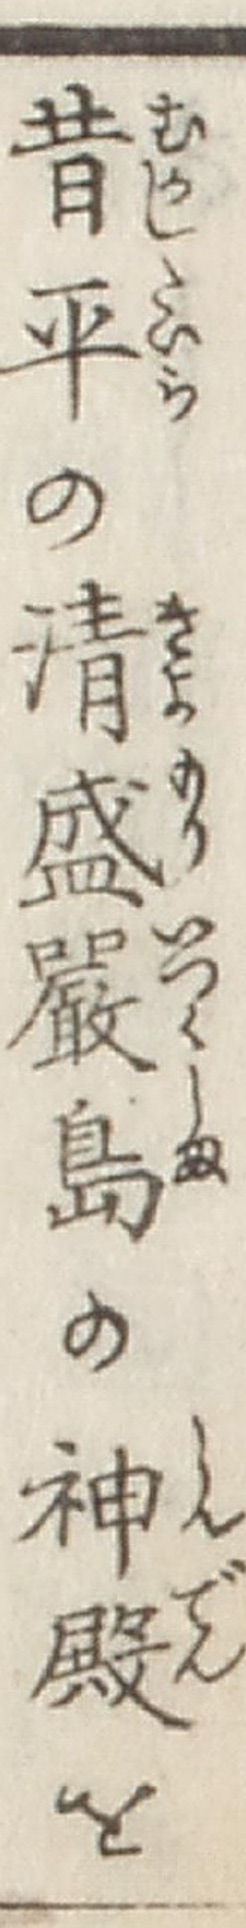昔平の清盛厳島の神殿を
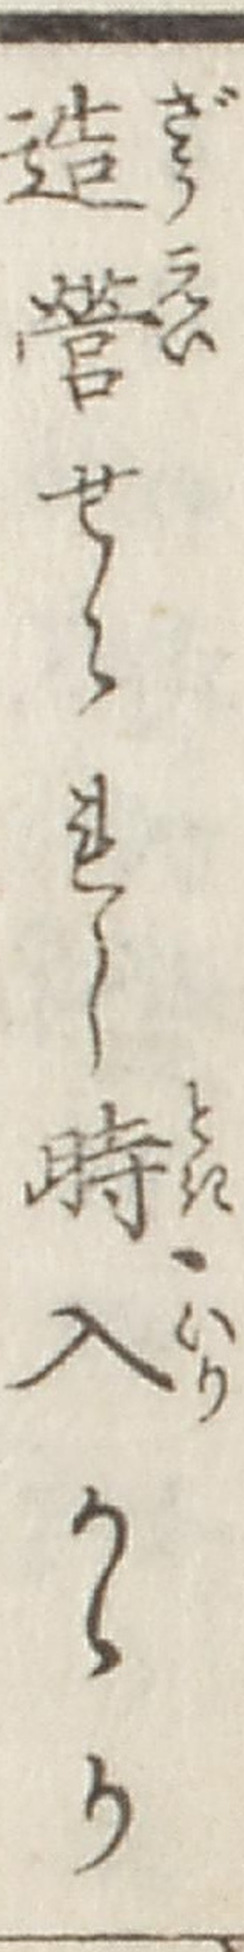造営せられし時、入かゝり
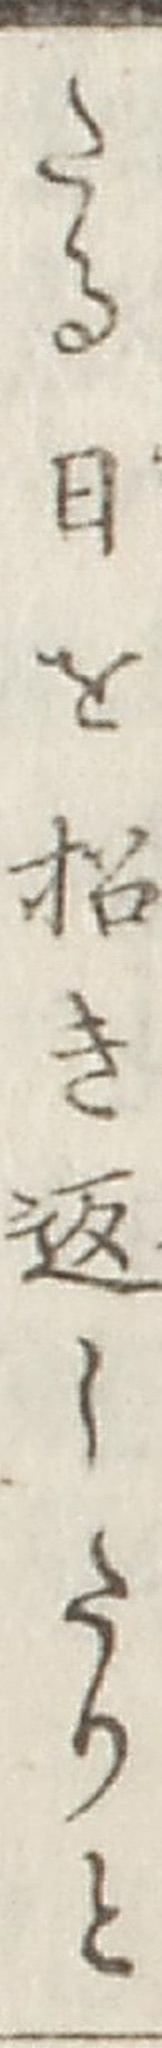たる日を招き返したりと
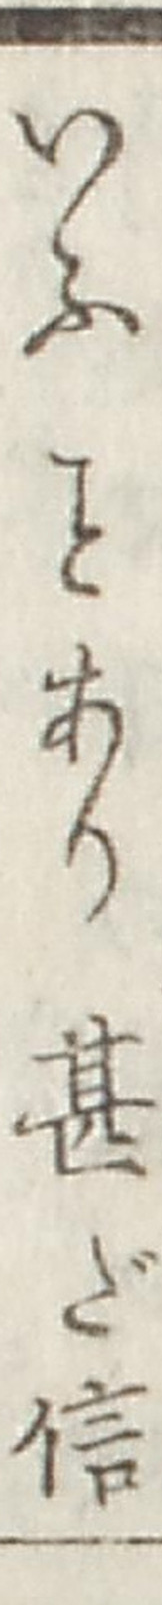いふことあり、甚だ信
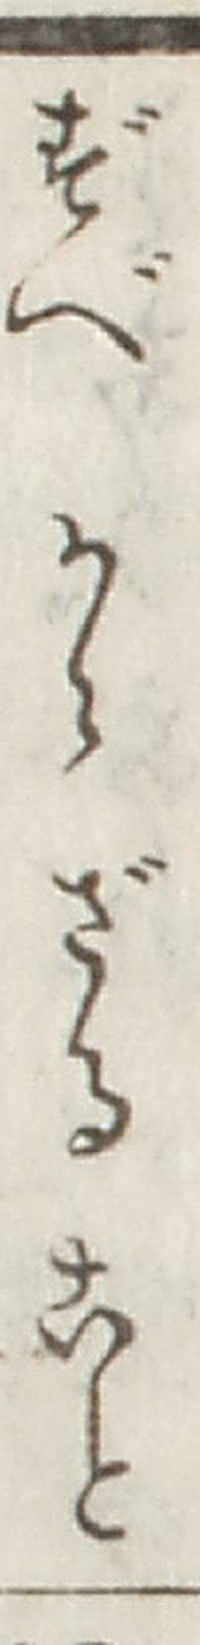ずべからざること
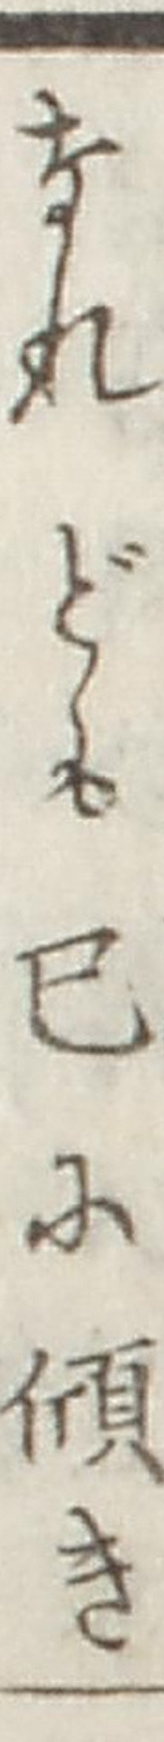なれども、已に傾き
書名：変異辯　一名、天變地異拾遺　全
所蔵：東京大学地震研究所図書室 Earthquake Research Institute Library, The University of Tokyo, JAPAN
